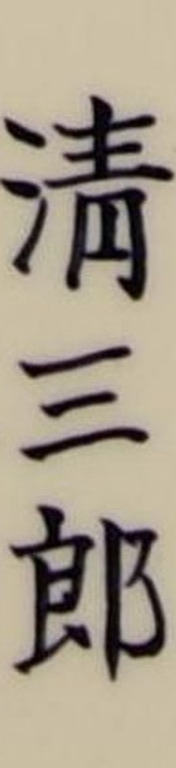清三郎
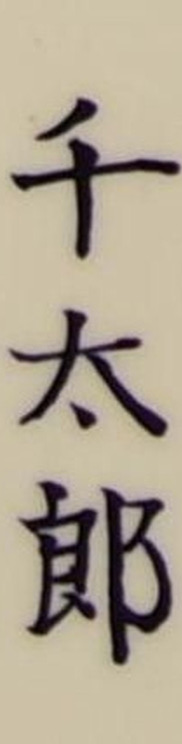千太郎
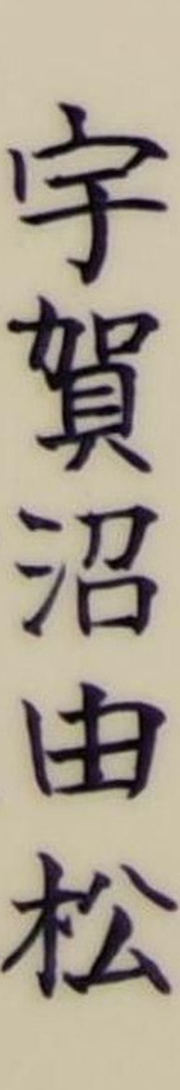宇賀沼由松
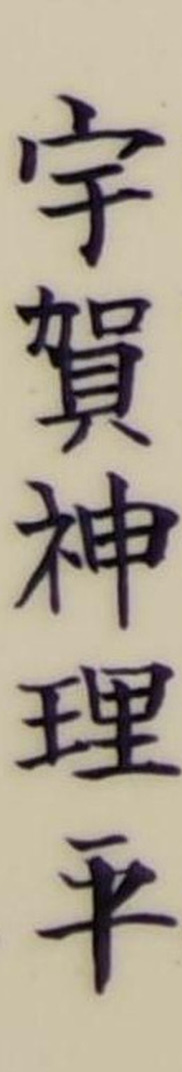宇賀神理平
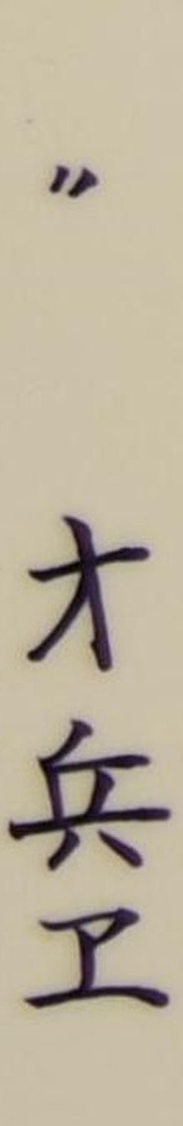オ兵ヱ
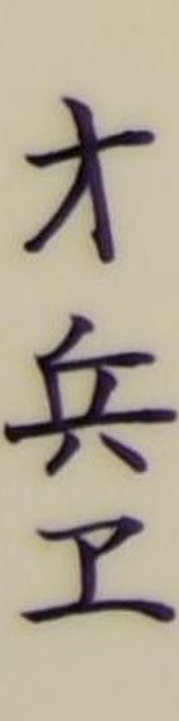オ兵ヱ

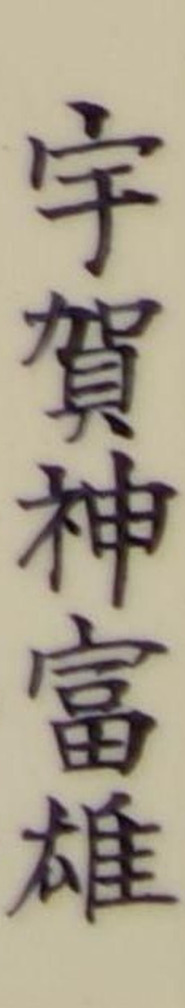宇賀神富雄
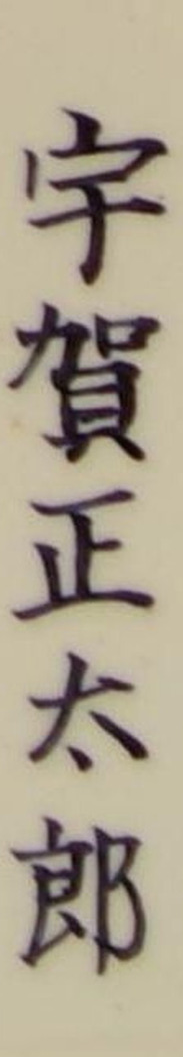宇賀正太郎
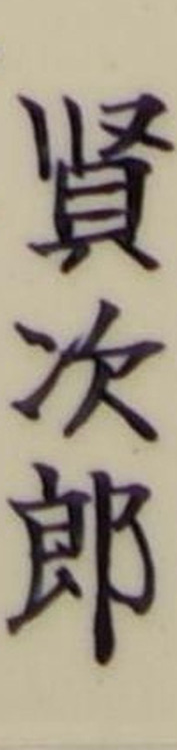賢次郎
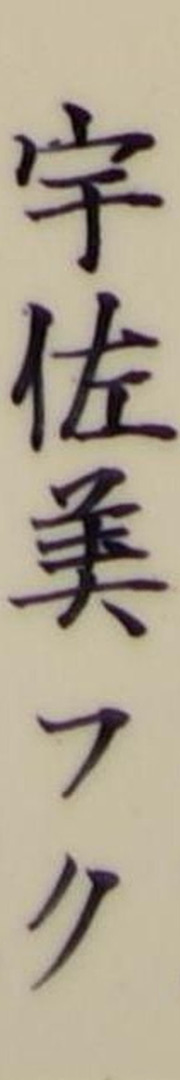宇佐美フク
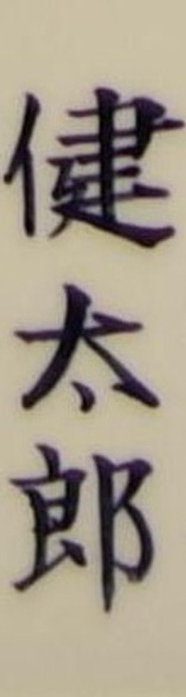健太郎
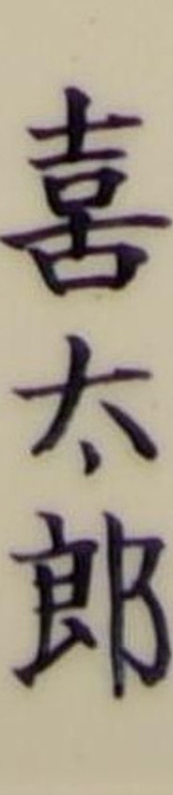喜太郎
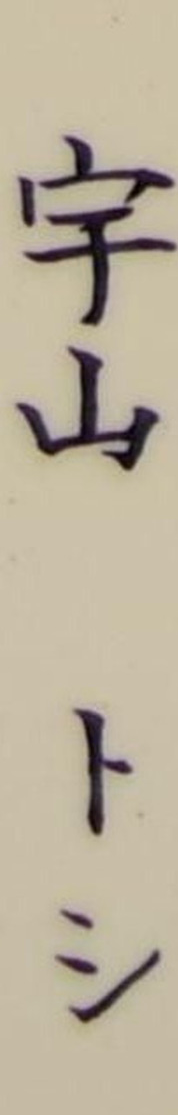宇山トシ
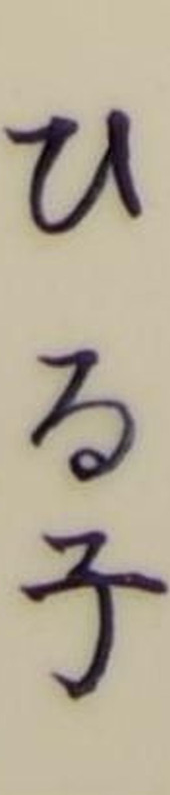ひる子
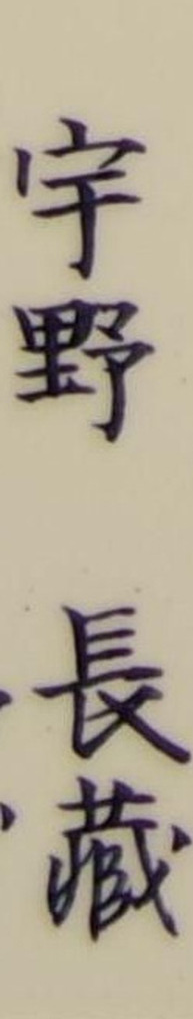宇野長蔵
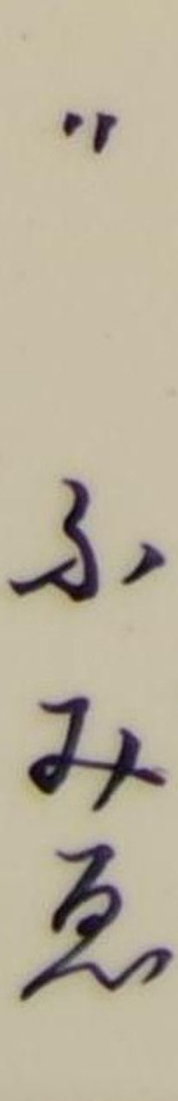ふみゑ
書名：A~D
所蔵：koyasan kongobuji
